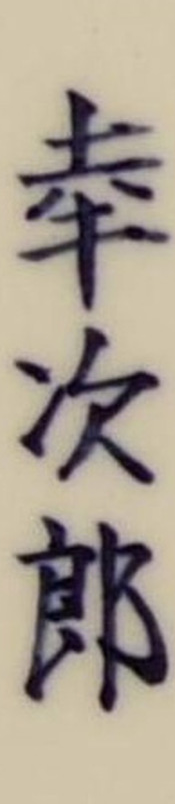幸次郎
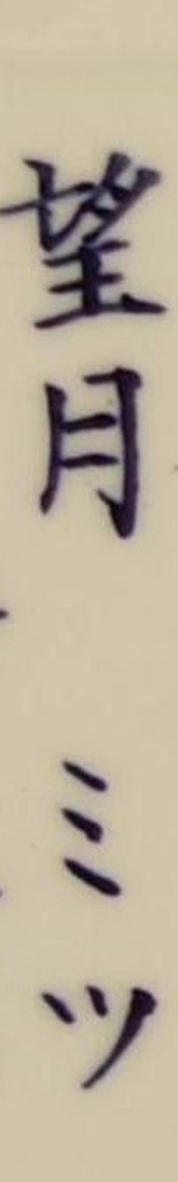望月ミツ
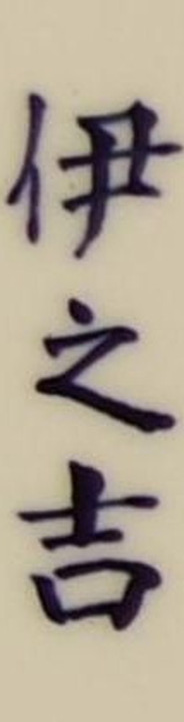伊之吉
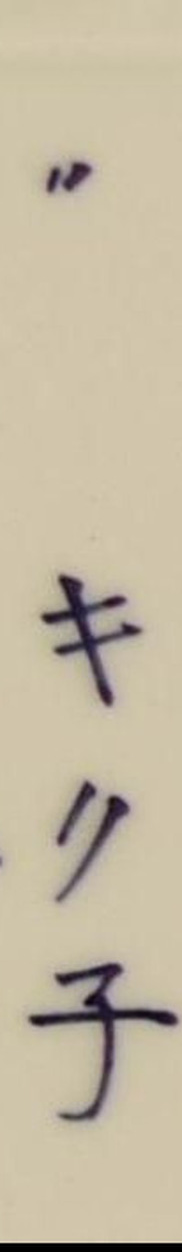キク子
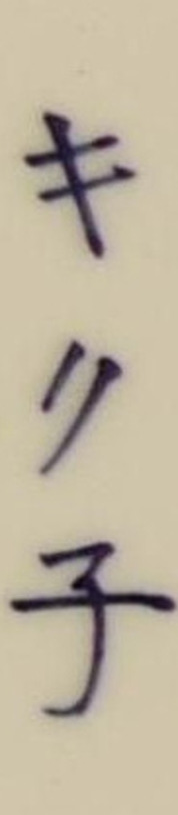キク子

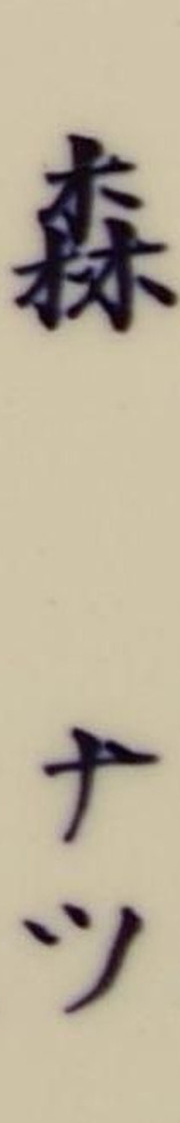森ナツ
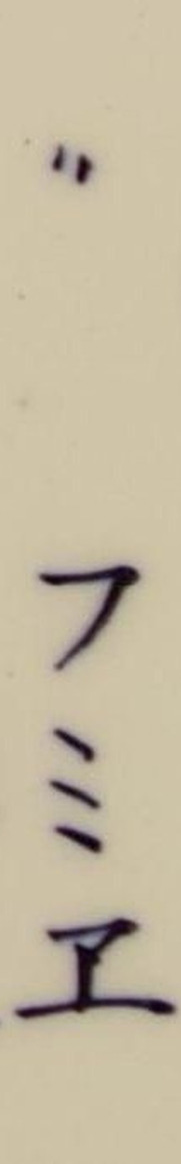フミエ
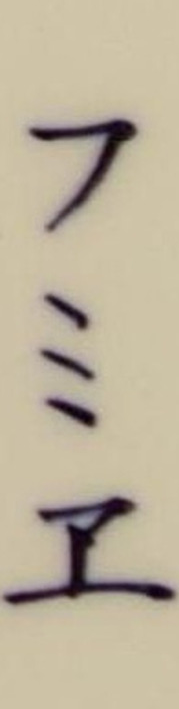フミエ
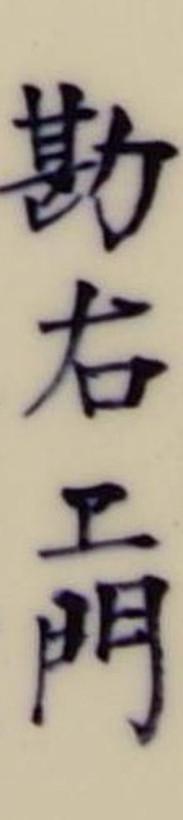勘右衛門
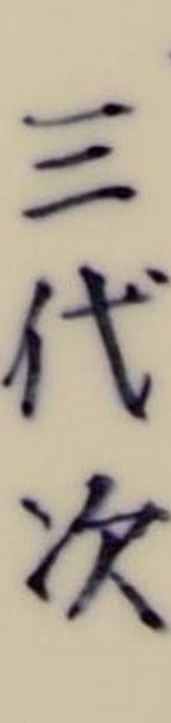三代次
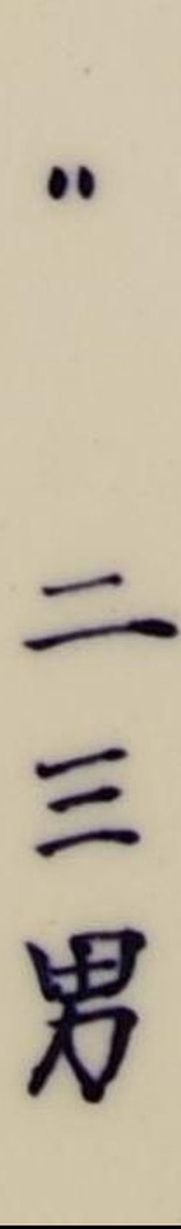二三男
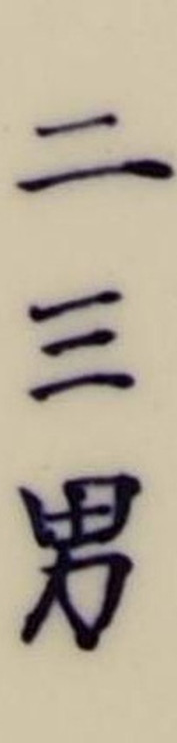二三男
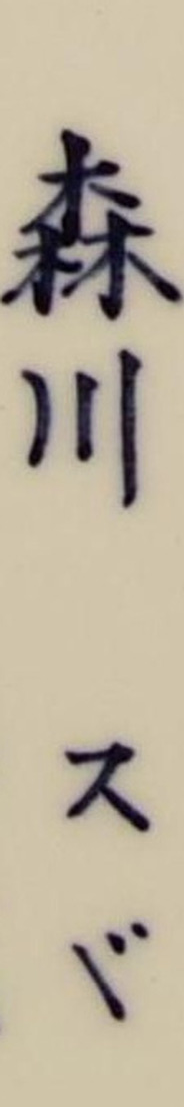森川スヾ
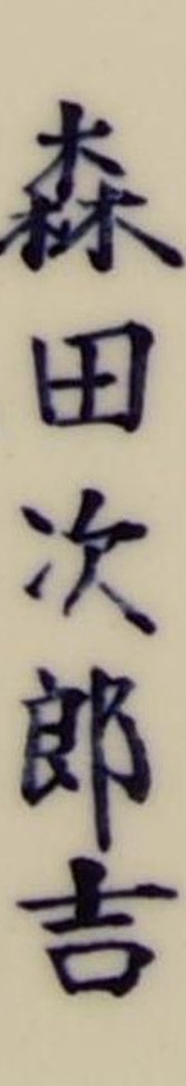森田次郎吉
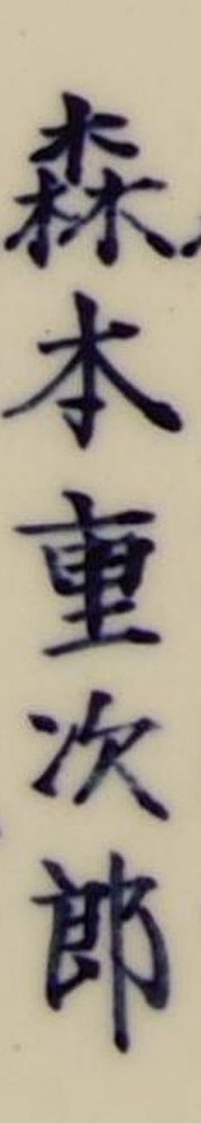森本重次郎
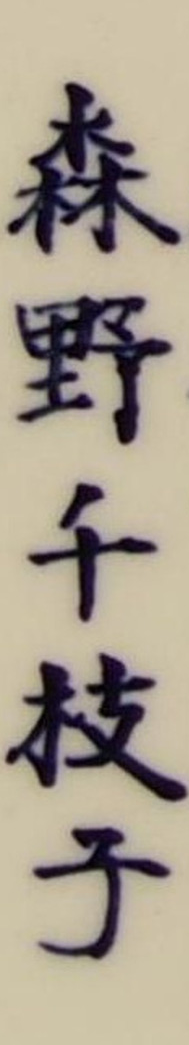森野千枝子
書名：E~L
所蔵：高野山金剛峯寺
